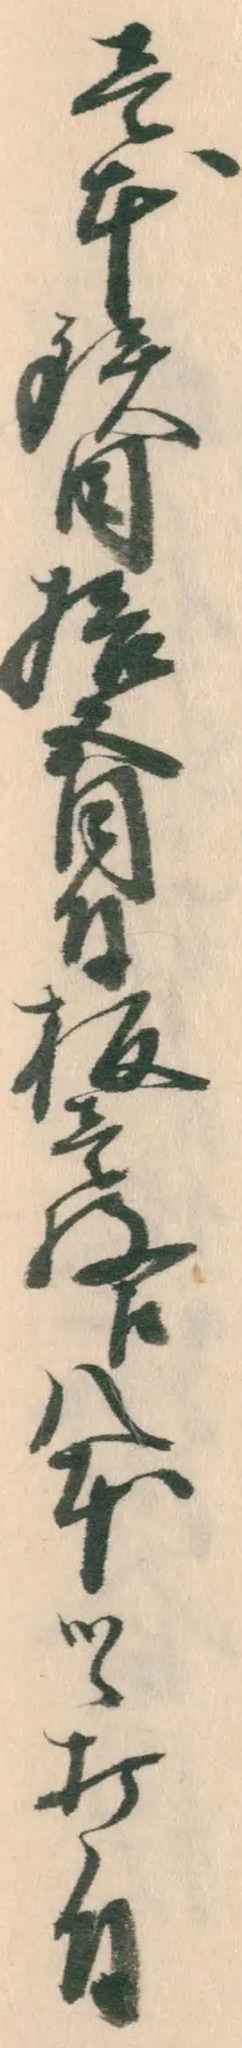壱本鉄目拾五目付板壱枚え八本ツヽ打付
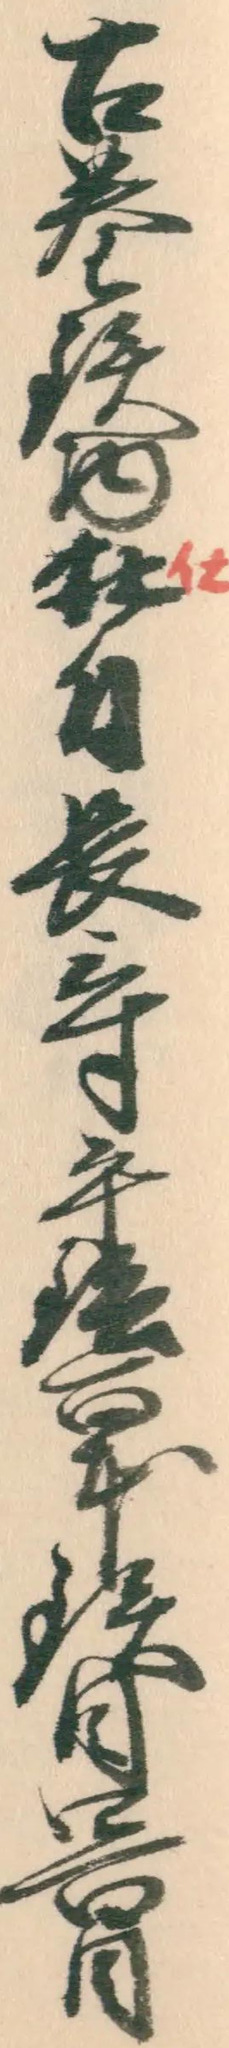古巻鉄物仕付長三寸平鋲百本鉄目四百目
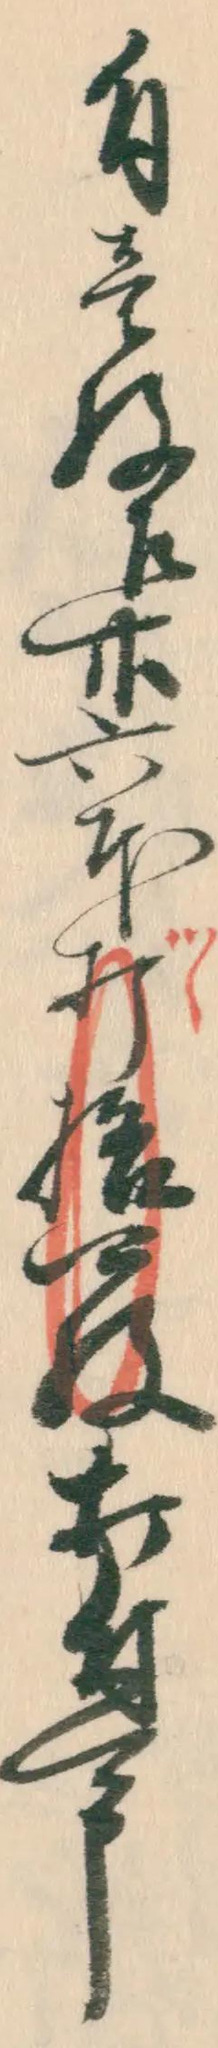付壱枚え廿六本「打拾四枚」打付可申
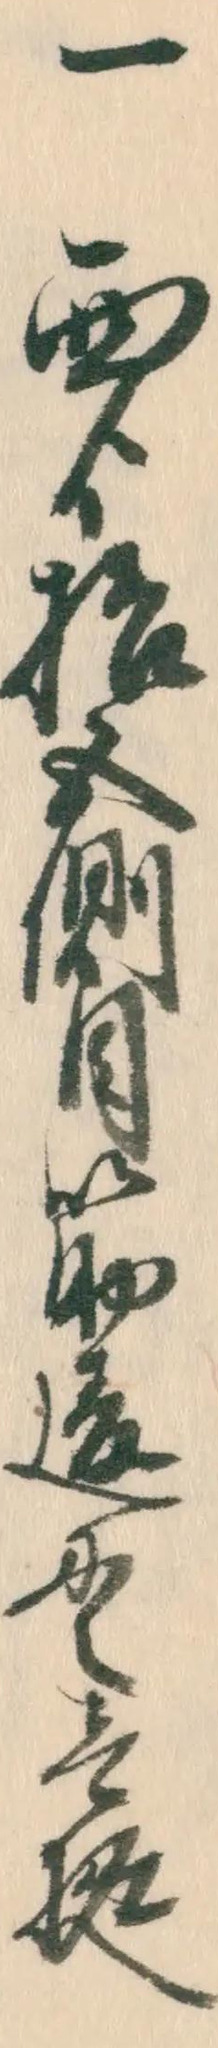一西ゟ拾五側目筋違貫壱挺
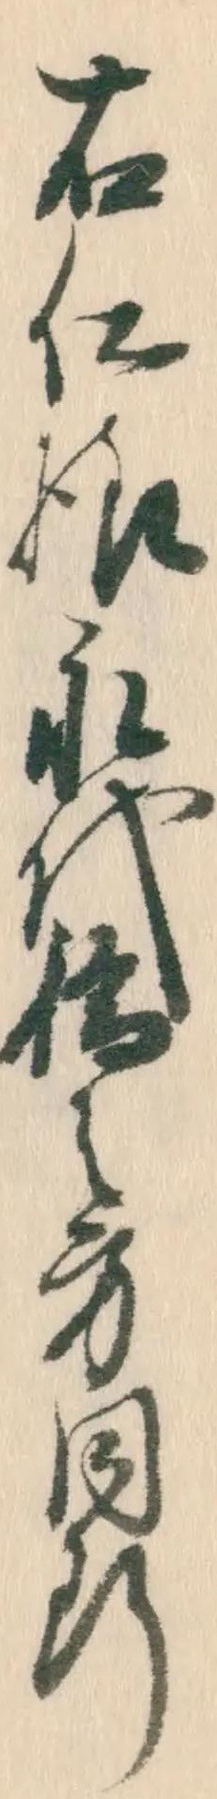右仕様永代橋之方同断
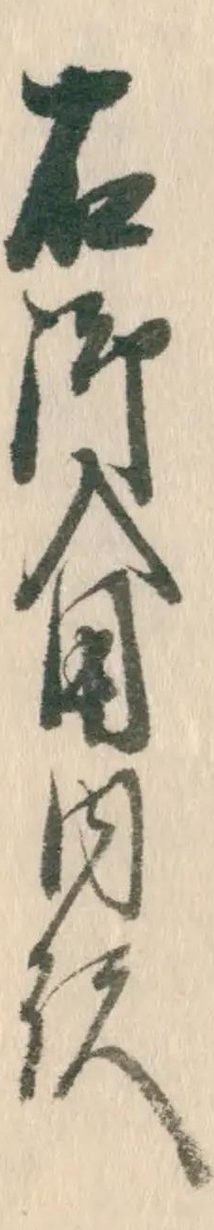右御入用内訳
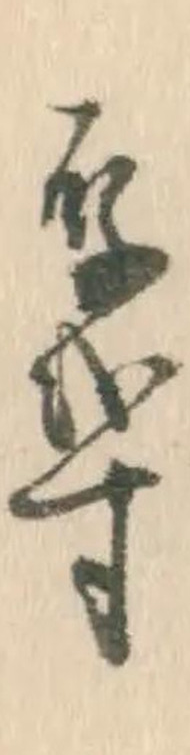厚弐寸

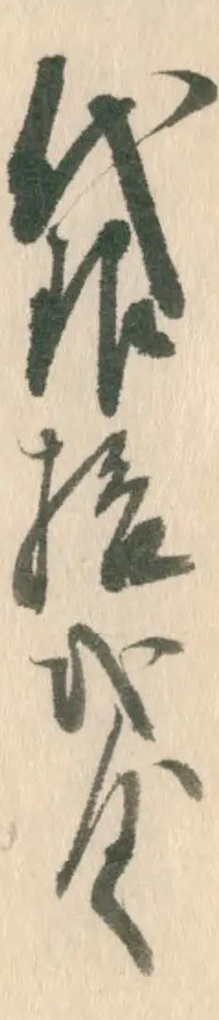代銀拾弐匁
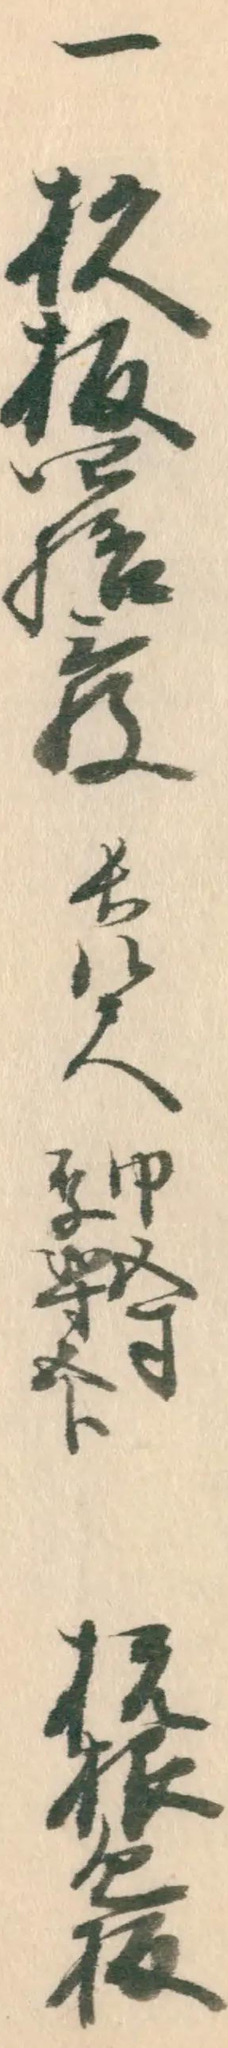一杉板四拾三枚長八尺巾五寸杭根包板
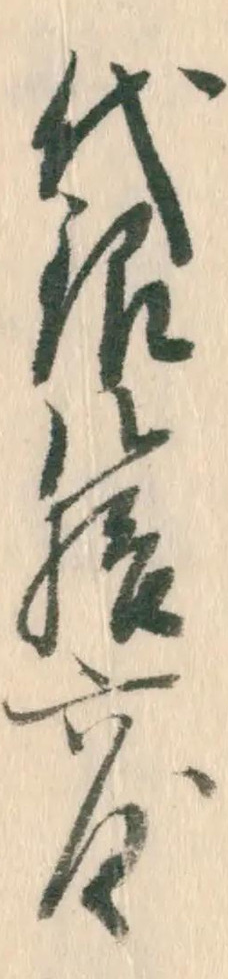代銀拾弐匁
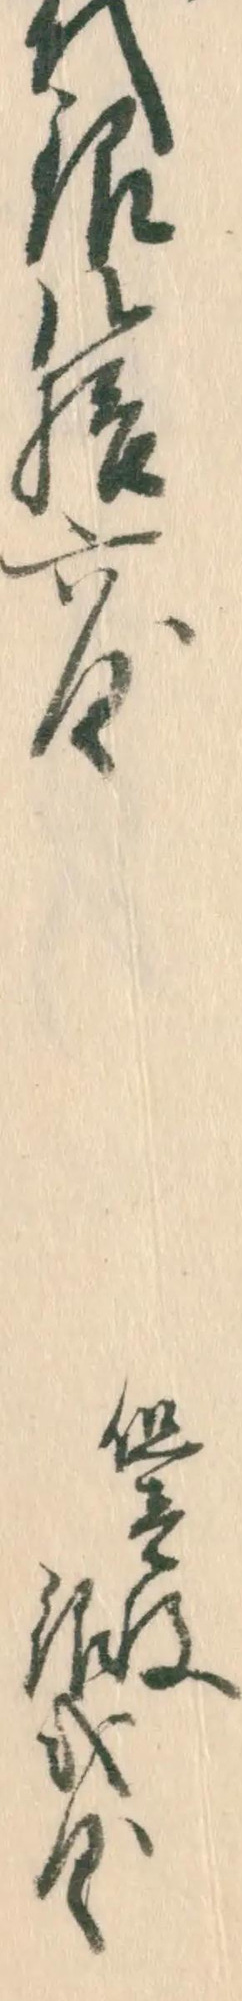代銀八拾六匁但壱枚銀弐匁
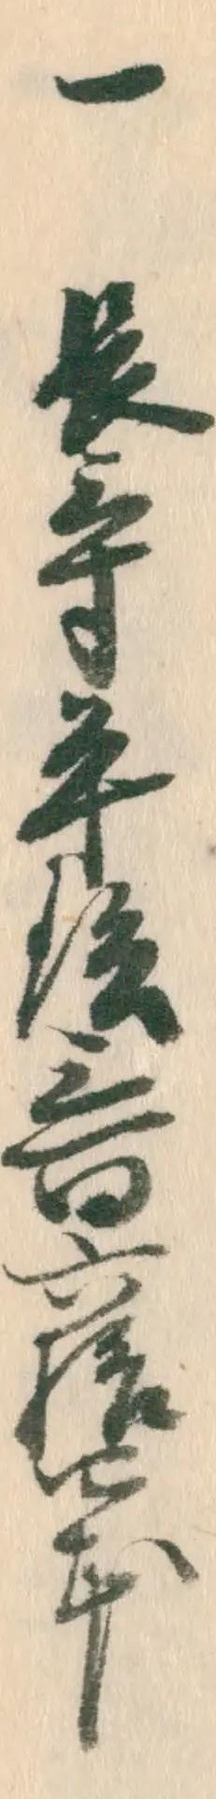一長三寸平鋲三百六拾四本
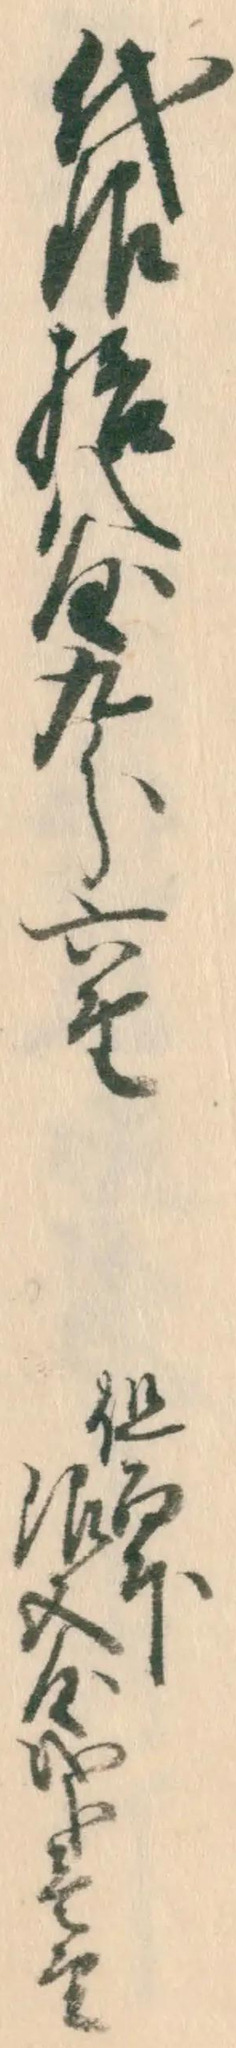代銀拾八匁九分六厘但百本銀五匁弐分壱厘
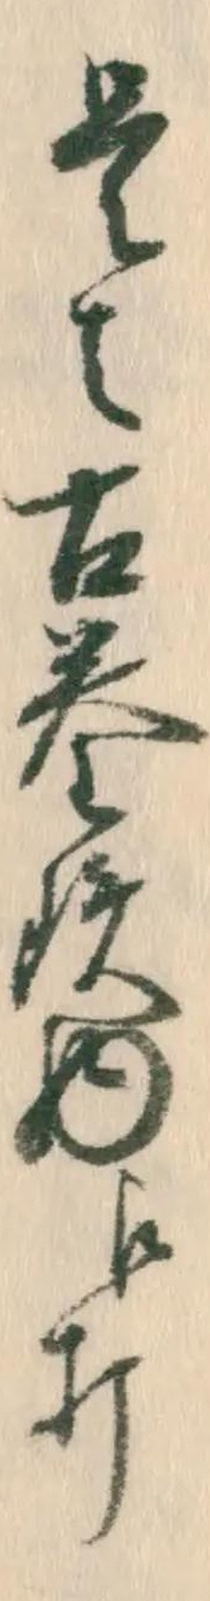是は古巻鉄物え打
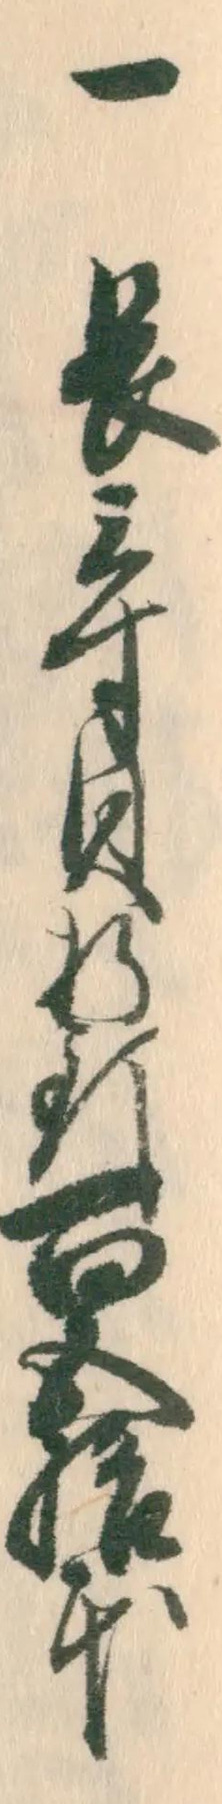一長三寸貝折釘百五拾本
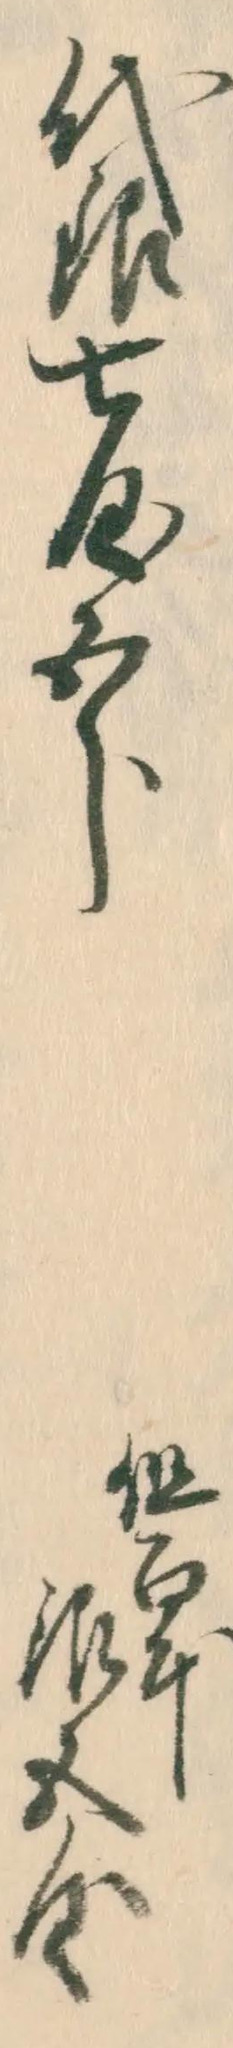代銀七匁五分但百本銀五匁
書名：三橋 17巻. [8] 三橋小破御修復書留　但御奉行御掛リ替地震潰橋番屋　嘉永四亥年より安政二卯年迄　下
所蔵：国立国会図書館 National Diet Library, JAPAN
